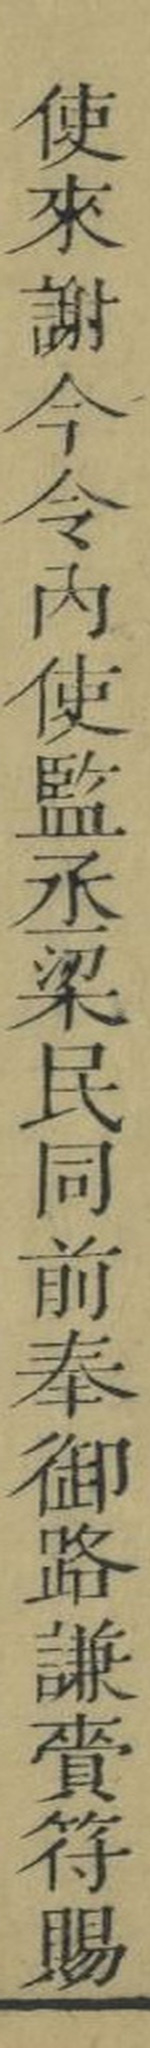使来謝今令内使監丞梁民同前奉御路謙賚符賜
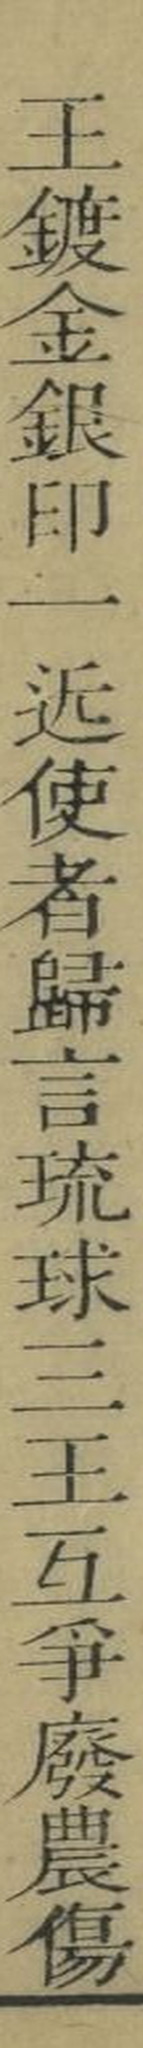王鍍金銀印一近使者帰言琉球三王互争廃農傷
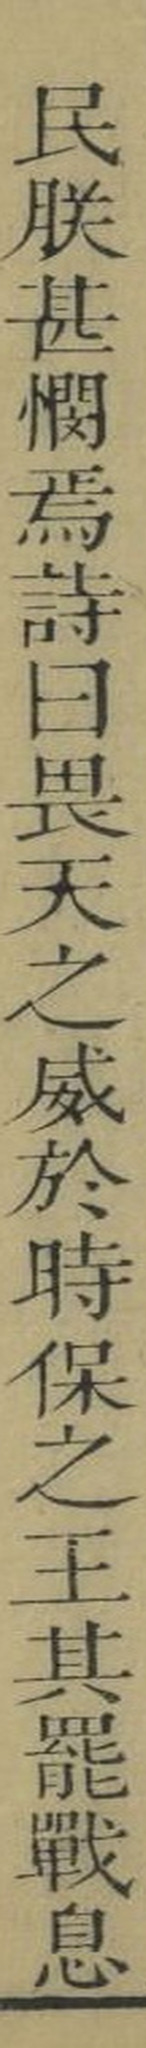民朕甚憫焉詩曰畏天之威於時保之王其罷戦息
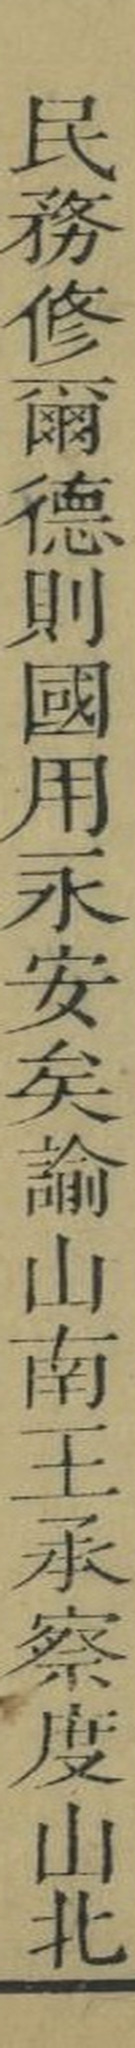民務修爾徳則国用永安矣諭山南王承察度山北
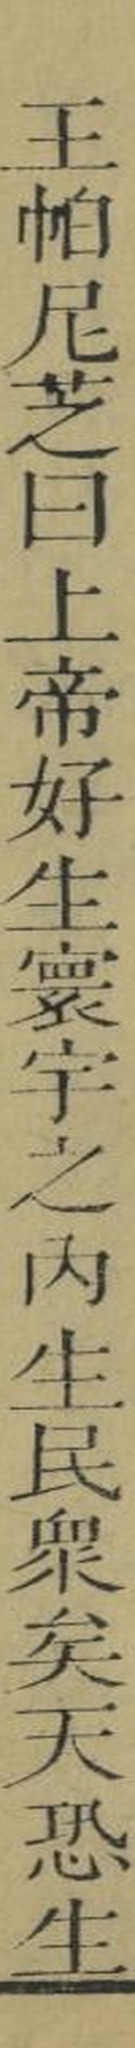王帕尼芝曰上帝好生寰宇之内生民衆矣天恐生
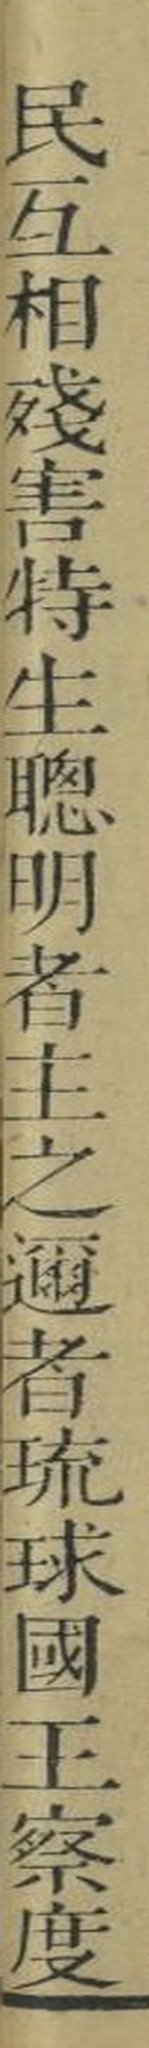民互相残害特生聡明者主之邇者琉球国王察度
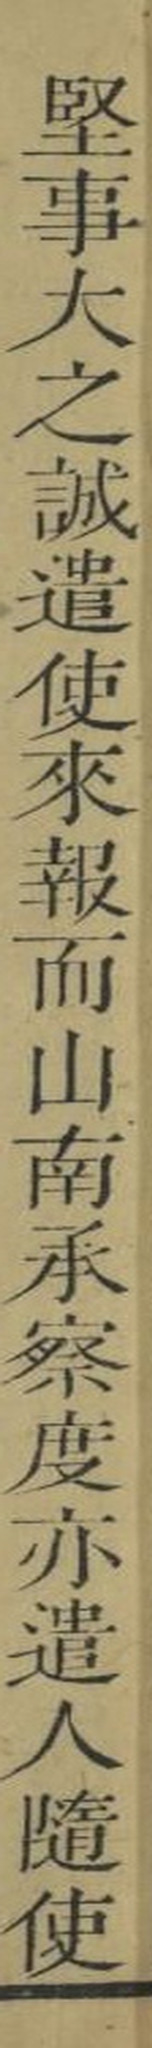堅事大之誠遣使来報而山南承察度亦遣人随使
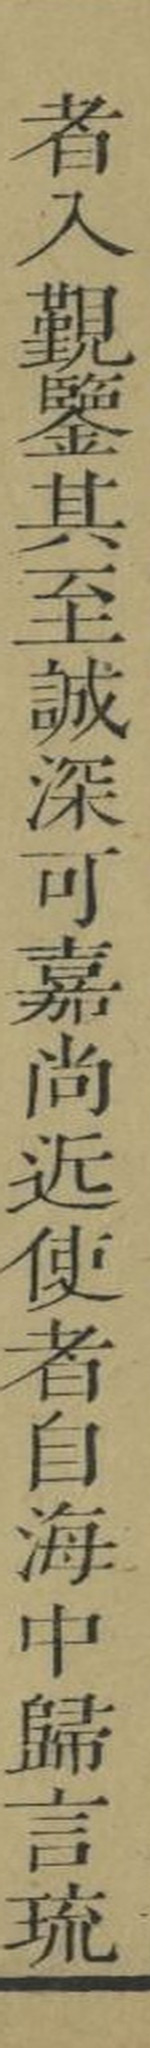者入覲鑑其至誠深可嘉尚近使者自海中帰言琉
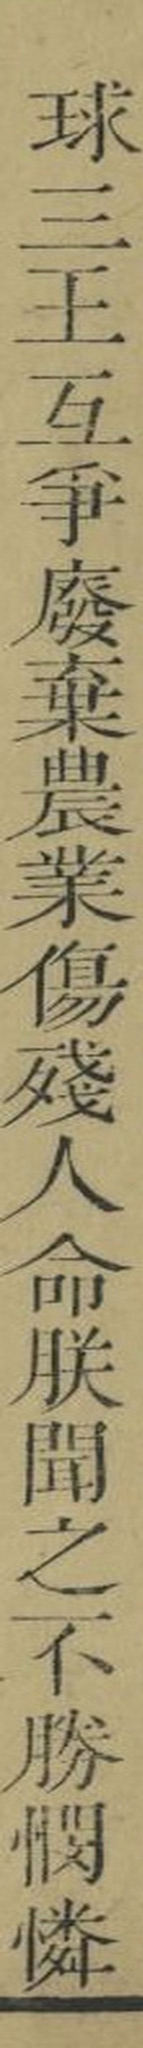球三王互争廃棄農業傷残人命朕聞之不勝憫憐
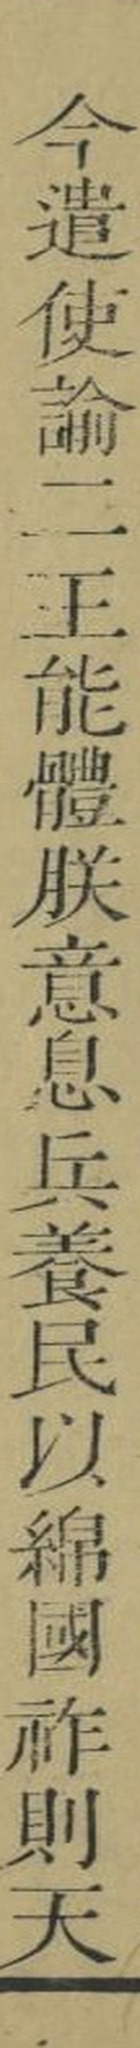今遣使諭二王能体朕意息兵養民以綿国祚則天
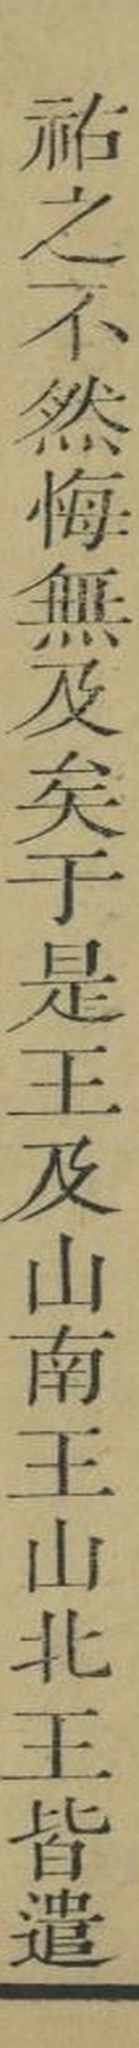祐之不然悔無及矣于是王及山南王山北王皆遣
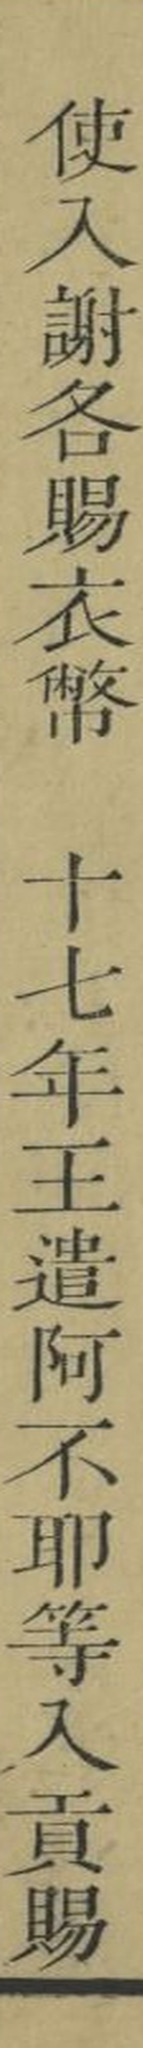使入謝各賜衣幣十七年王遣阿不耶等入貢賜
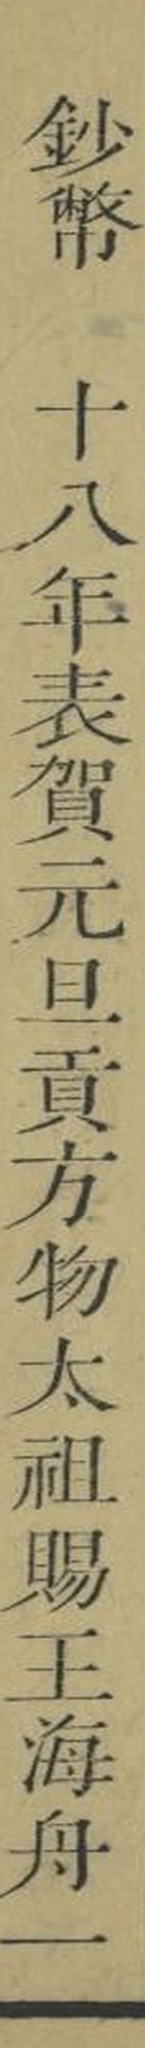鈔幣十八年表賀元旦貢方物太祖賜王海舟一
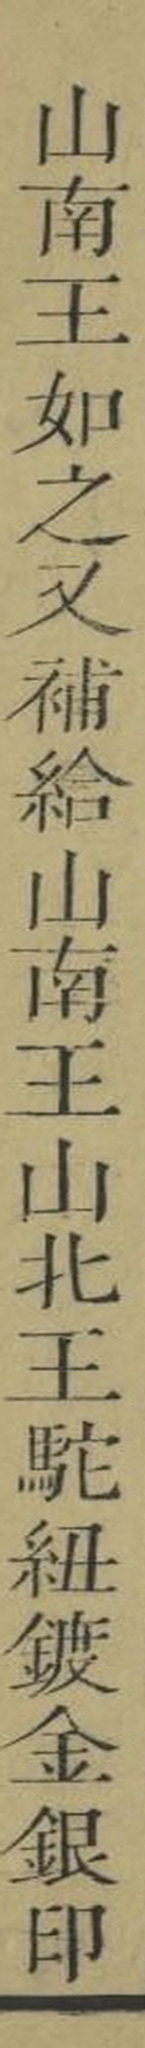山南王如之又補給山南王山北王駝紐鍍金銀印
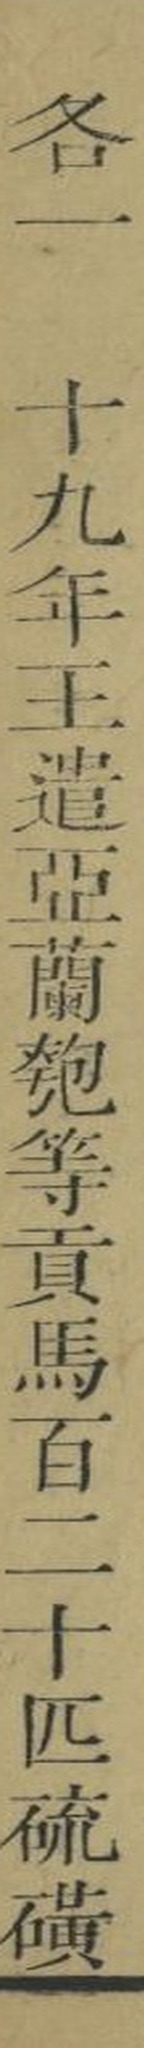各一十九年王遣亜蘭匏等貢馬百二十匹硫磺

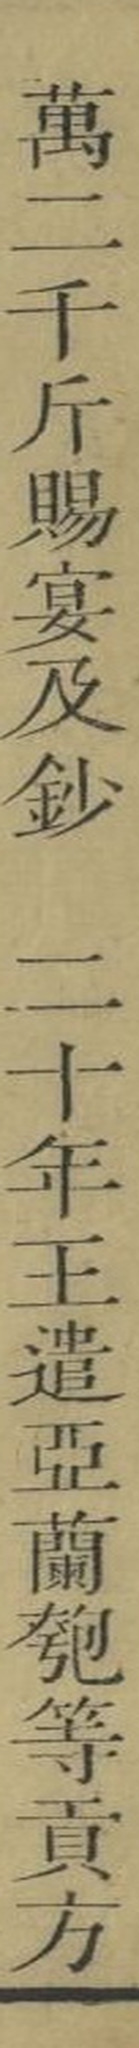万二千斤賜宴及鈔二十年王遣亜蘭匏等貢方
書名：中山伝信録 巻三
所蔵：University of the Ryukyus Library
